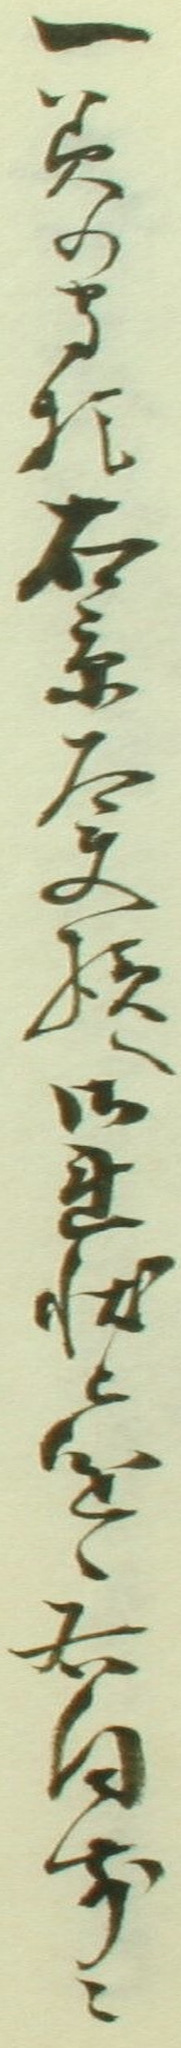一美の守様右京太夫様へ御連状被進候右同前ニ
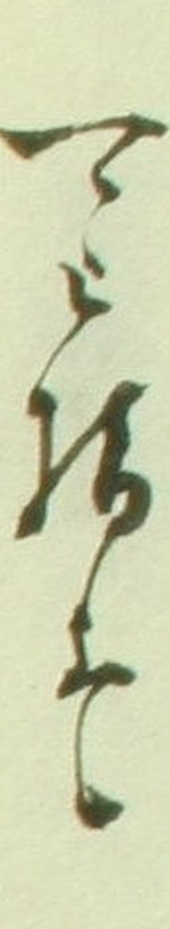可被指上候
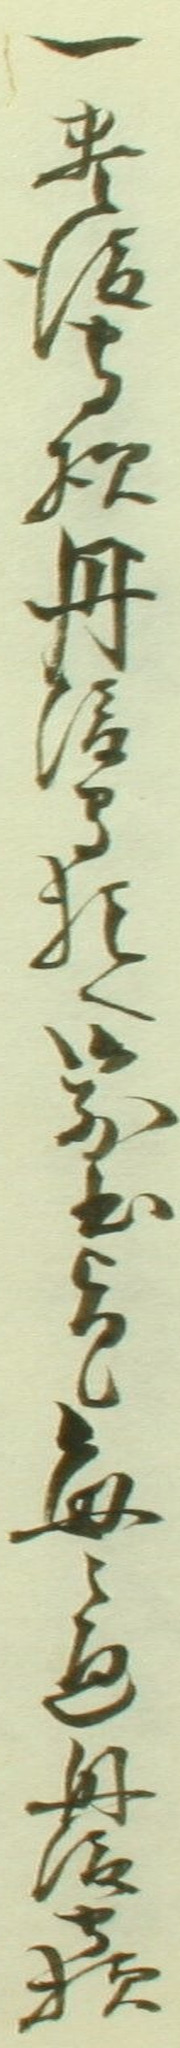一豊後守様丹後守様へ御別書旨候毎々通丹後守様
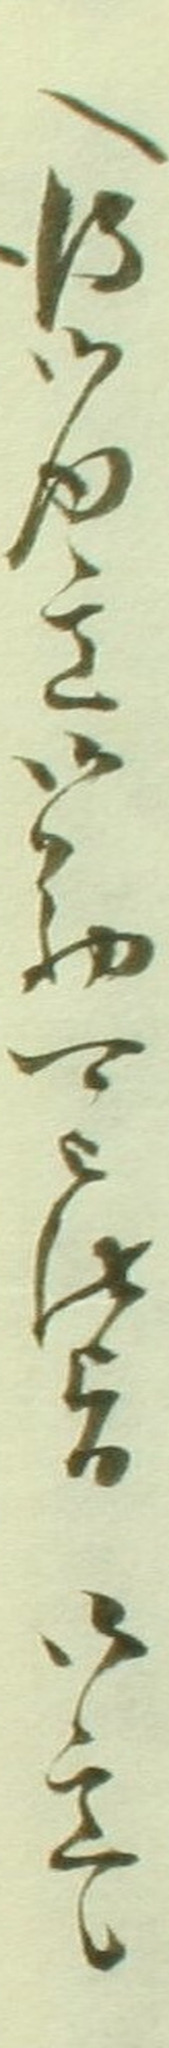へ得御内意御勤可被仕旨御意候
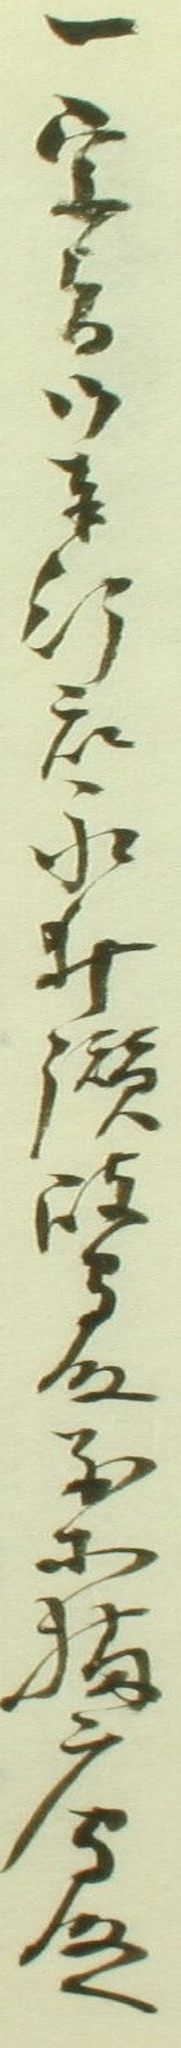一宗旨御奉行衆へ永井讃岐守殿別所播磨守殿へ
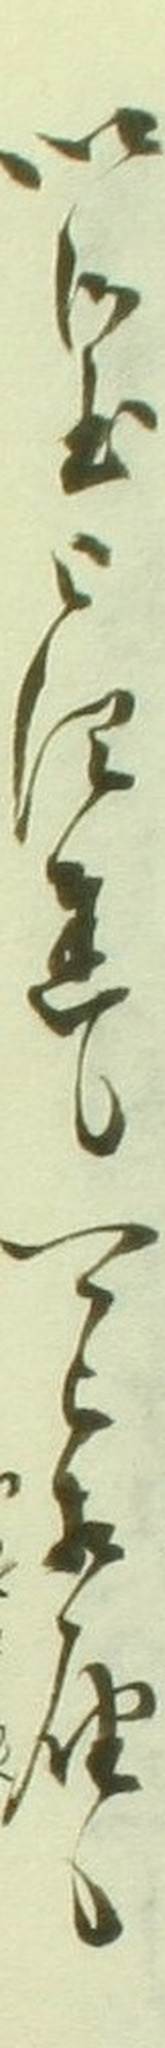以御書被任達候可被相届候
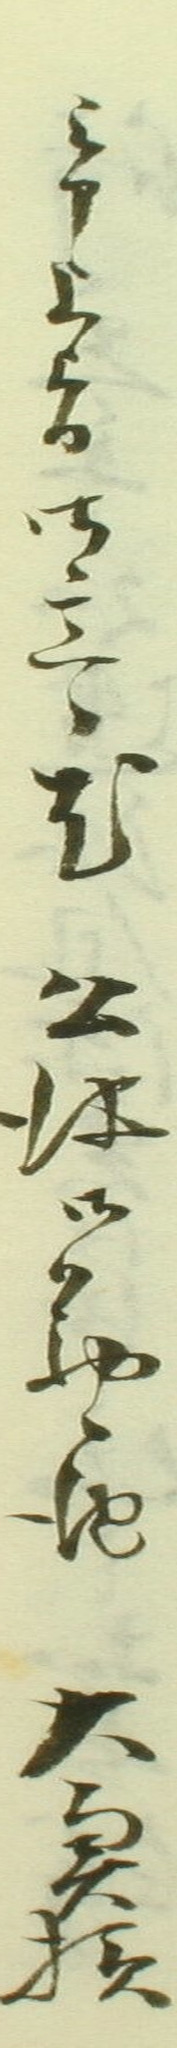被申上旨御意候尤公儀御勤候儀大奥様
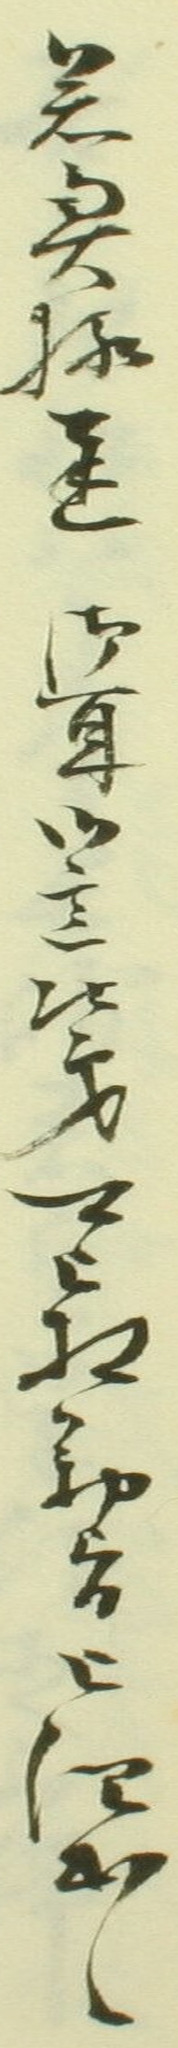若奥様達御耳御意次第可被相勤旨被仰出候
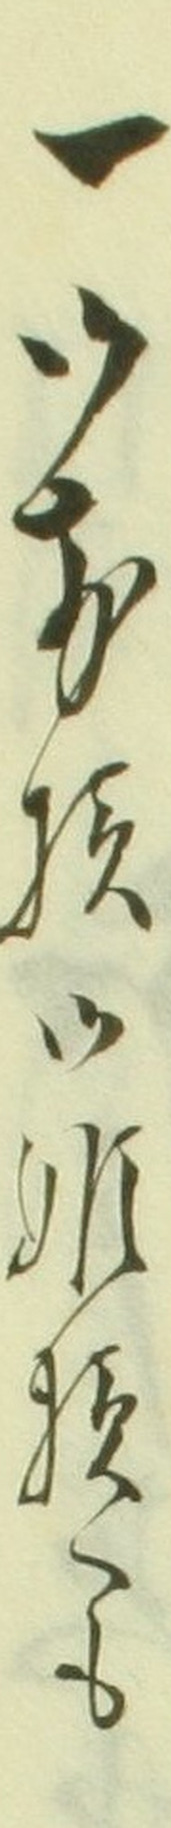一御前様御姫様へも
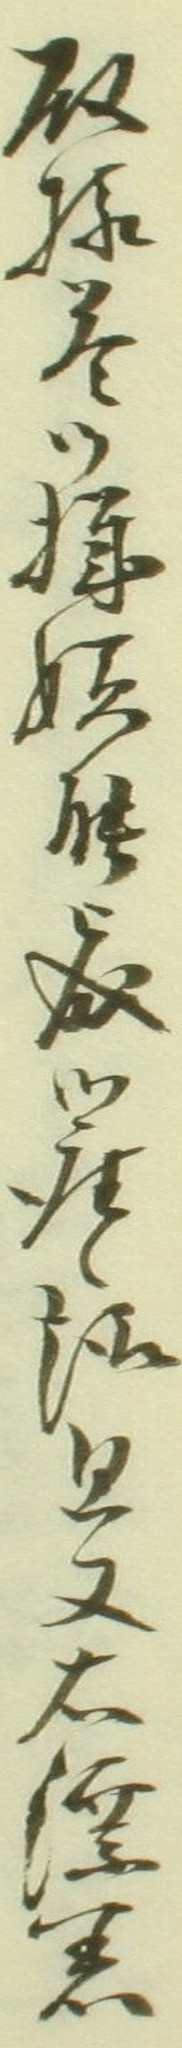殿様益御機嫌能被成御座候趣且又右漂着
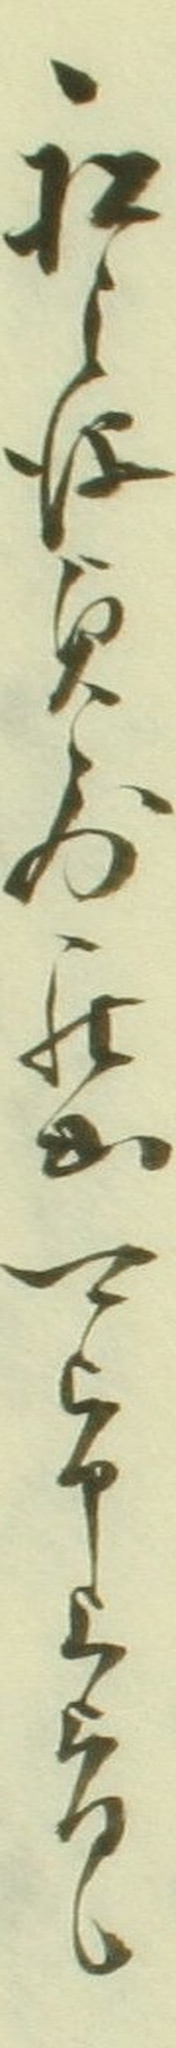船之儀貞右衛門罷出可被申上旨候
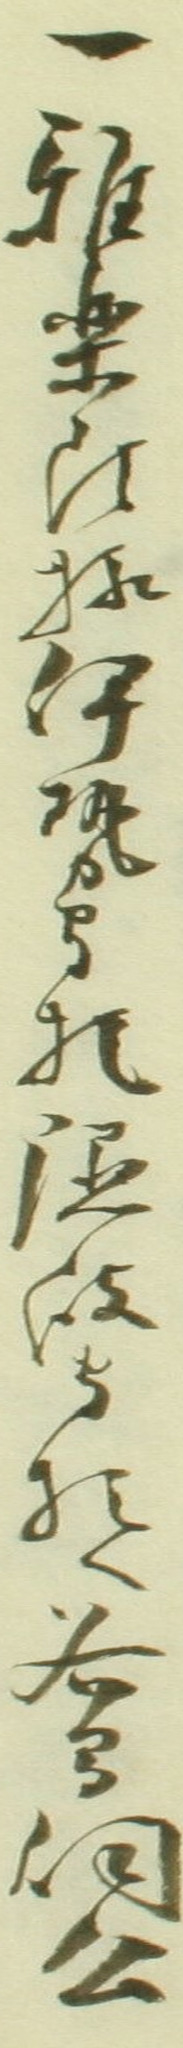一雅楽頭様伊勢守様隠岐守様へ各間伺公
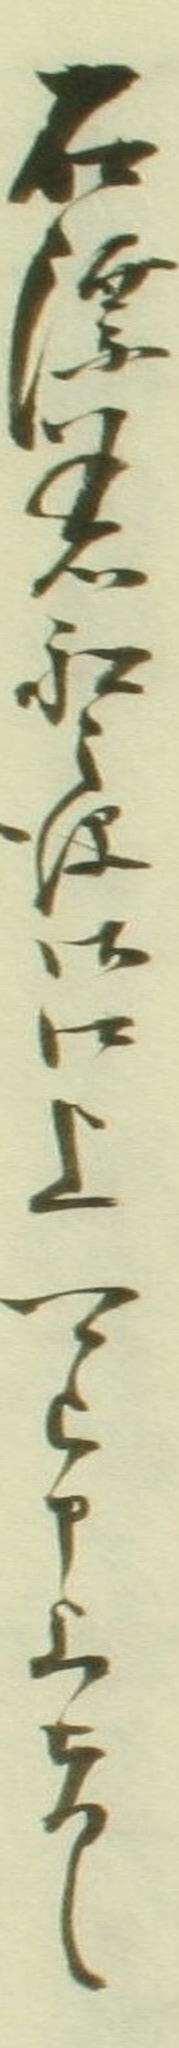右漂着船之儀御口上可被申上旨候
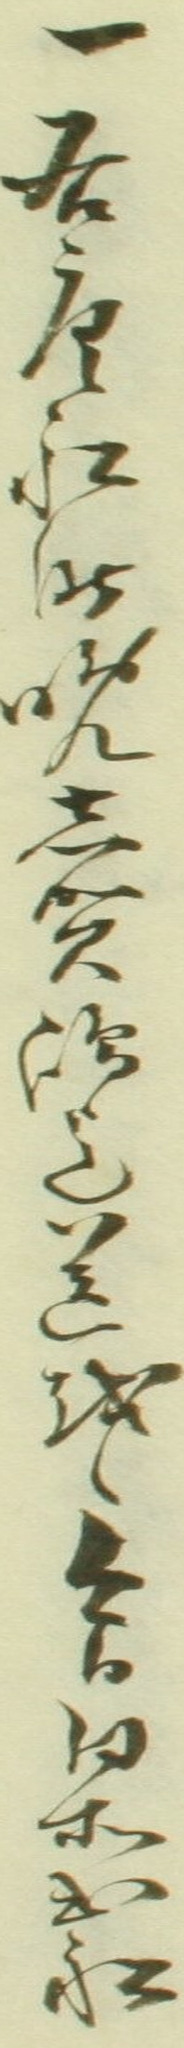一右唐船昨晩志賀嶋迄送越候今日同所出船
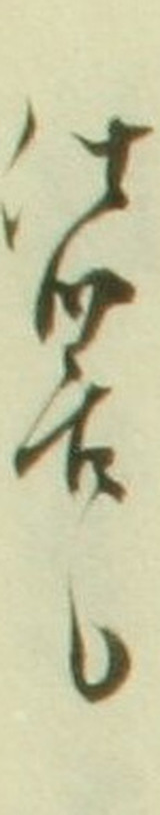仕筈候
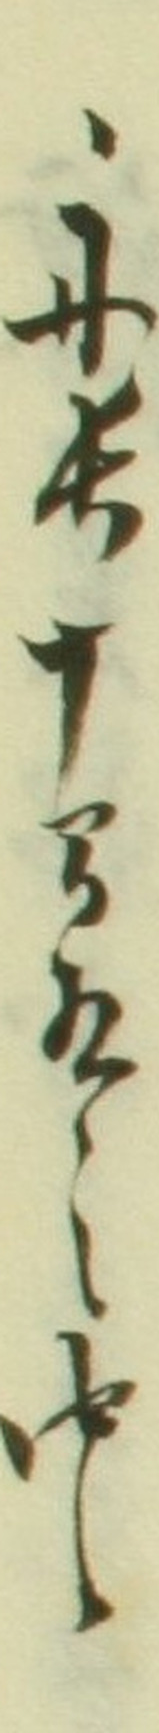舟長十間有之由候
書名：異国船漂着記
